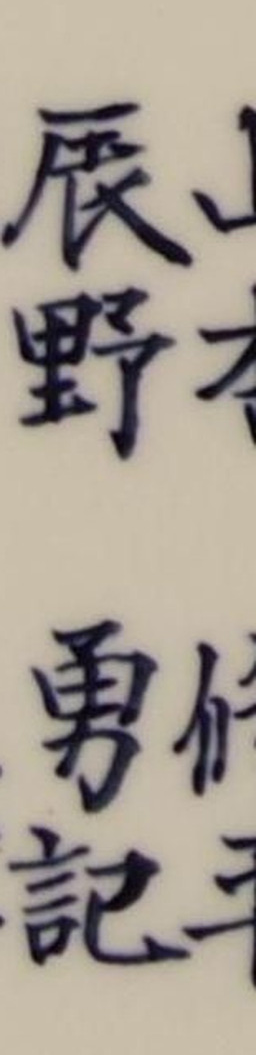辰野勇記
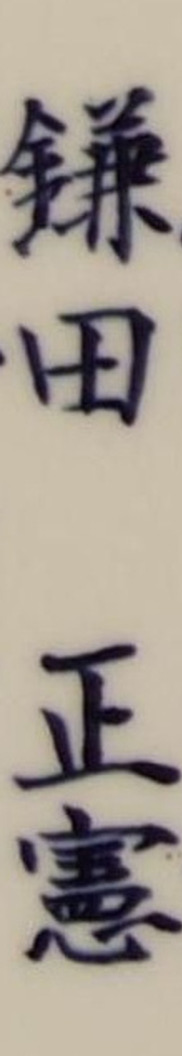鎌田正憲
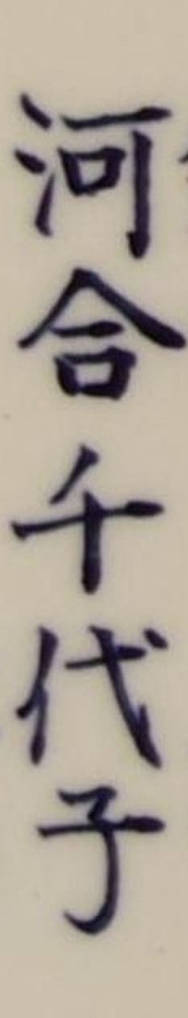河合千代子
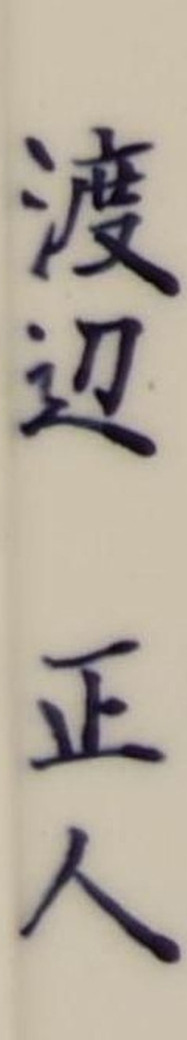渡辺正人

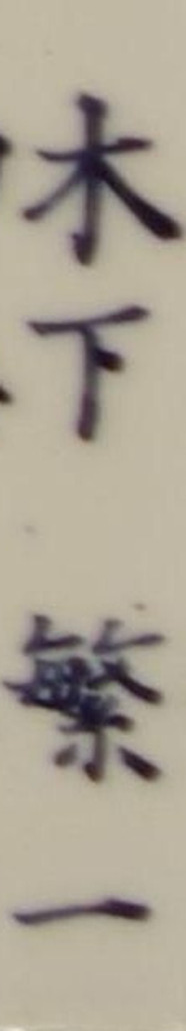木下繁一
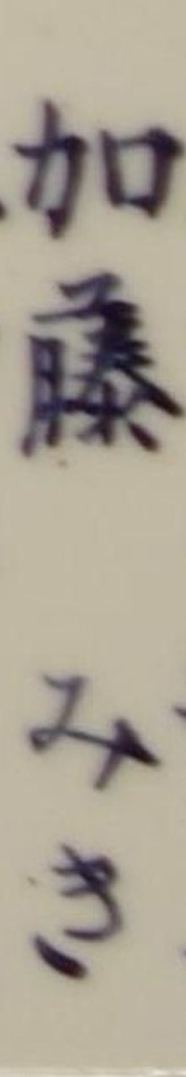加藤みき
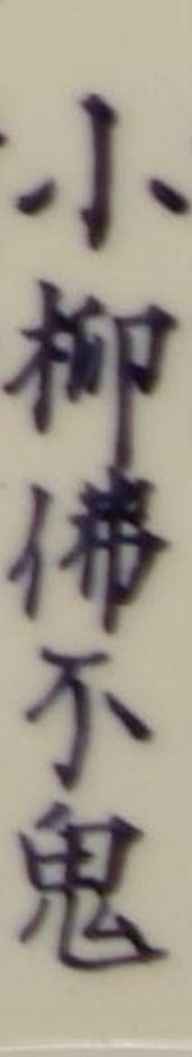小柳仏不鬼
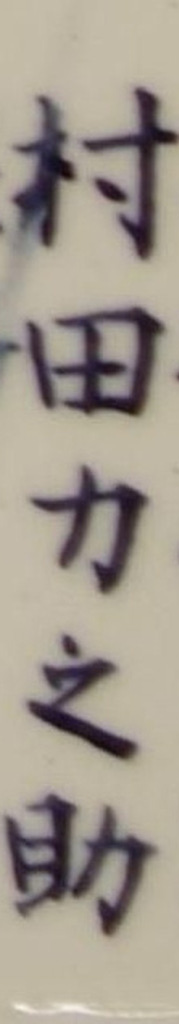村田力之助
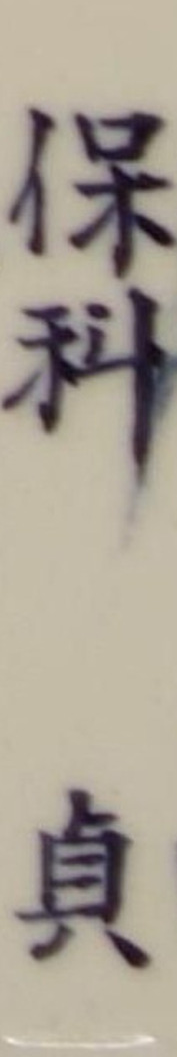保科貞
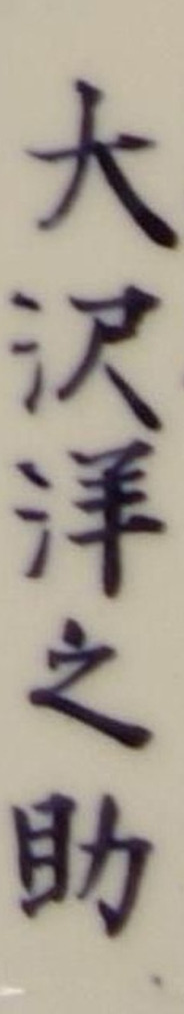大沢洋之助
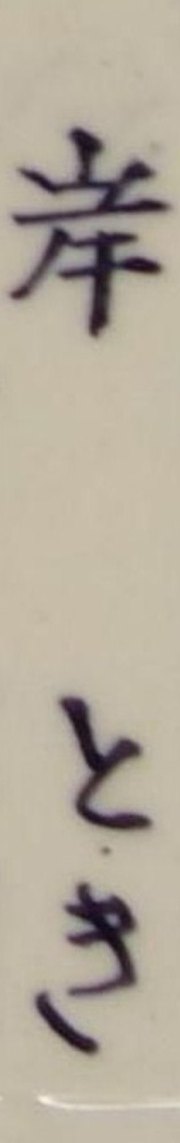岸とき
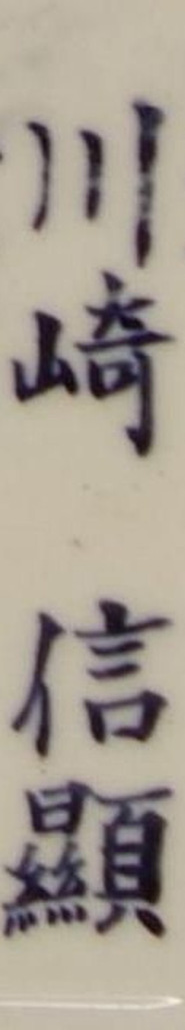川崎信顕
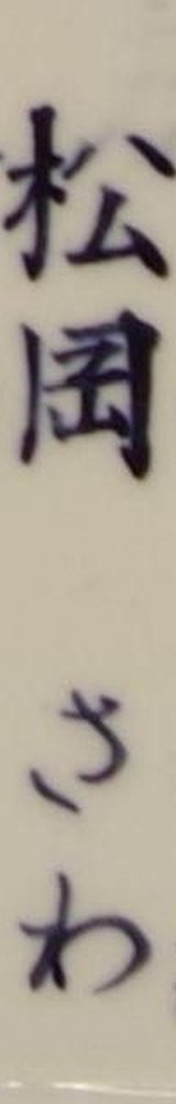松岡さわ
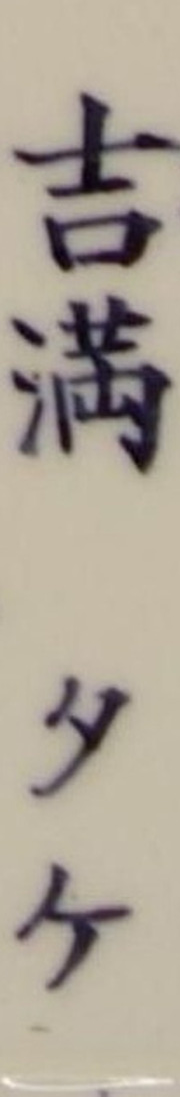吉満タケ
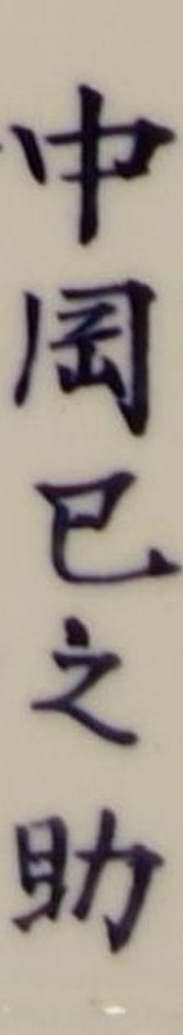中岡巳之助
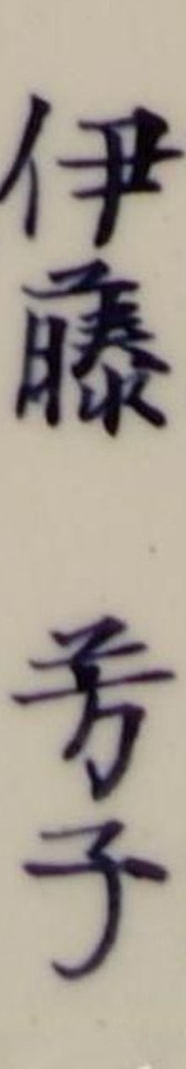伊藤芳子
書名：E~L
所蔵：高野山金剛峯寺
